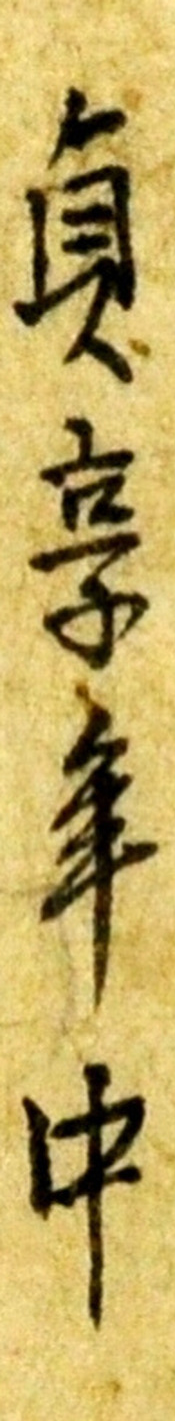貞享年中
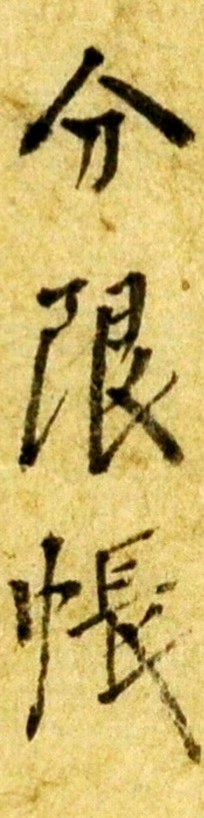分限帳

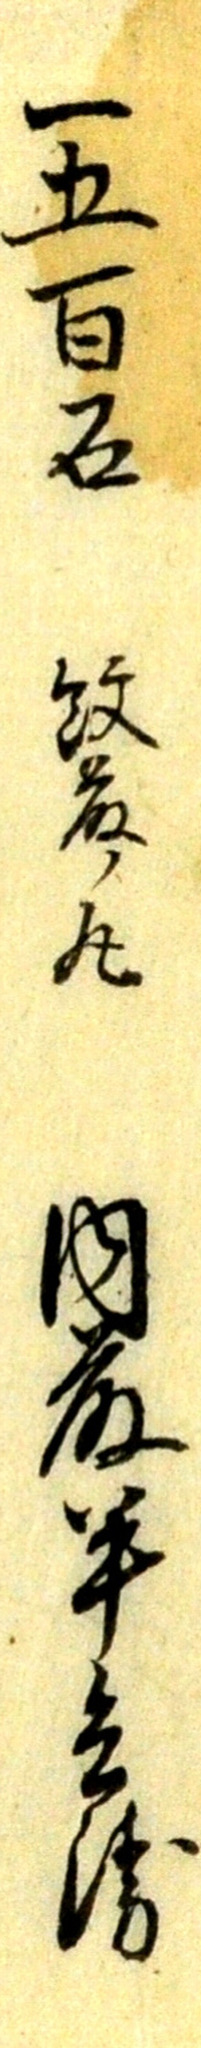一五百石紋藤ノ丸内藤半兵衛
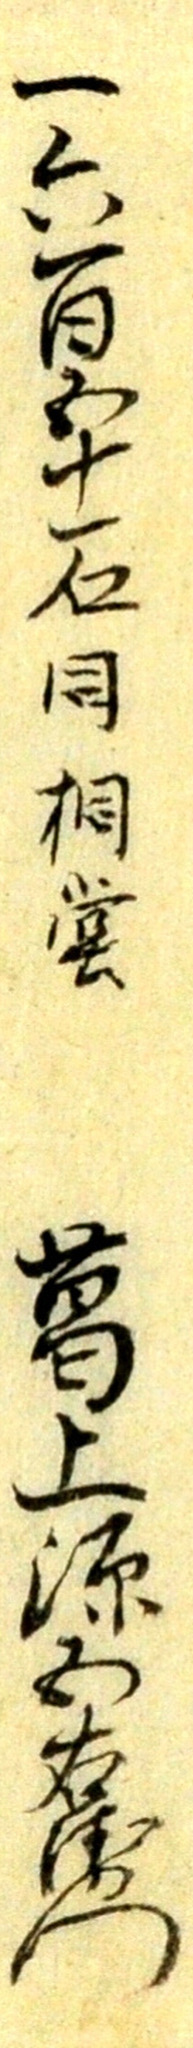一六百五十石同桐堂葛上源五右衛門
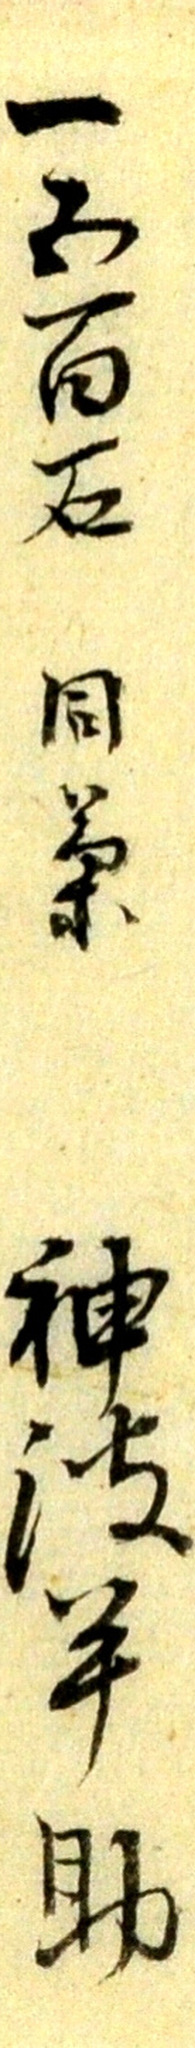一五百石同菊神波半助
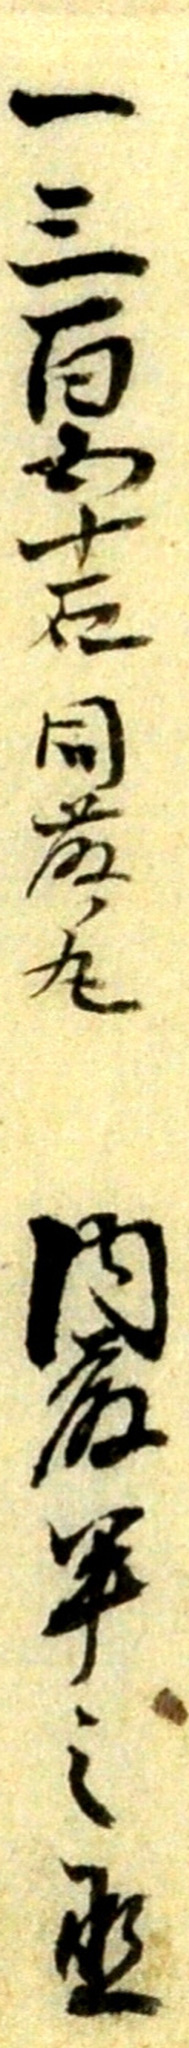一三百五十石同藤ノ丸内藤半之丞
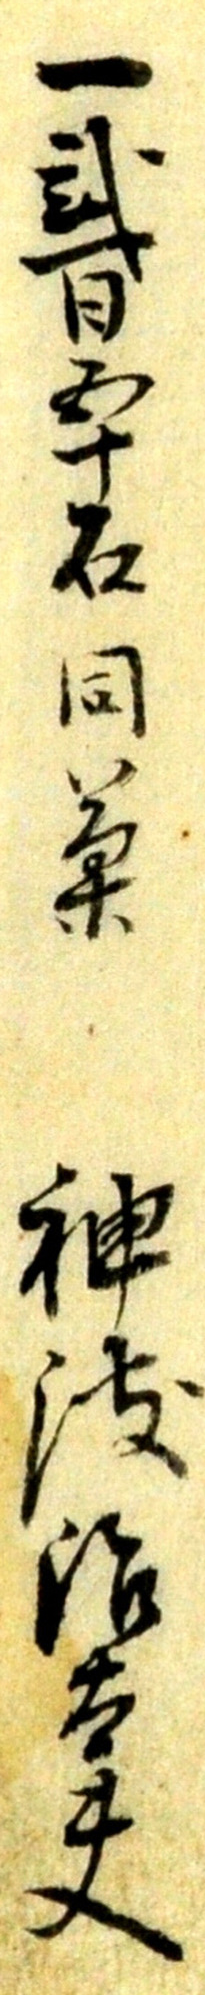一弐百五十石同菊神波治太夫
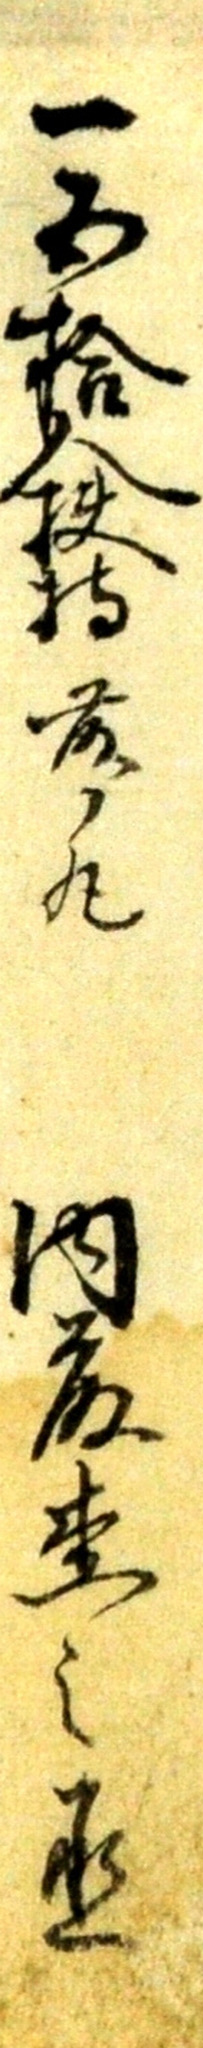一五拾人扶持藤ノ丸内藤杢之丞

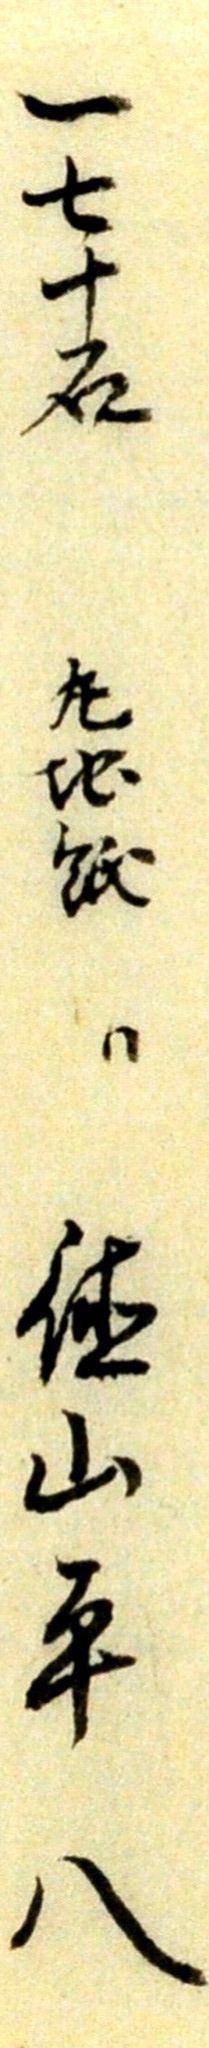一七十石丸地紙同徳山平八
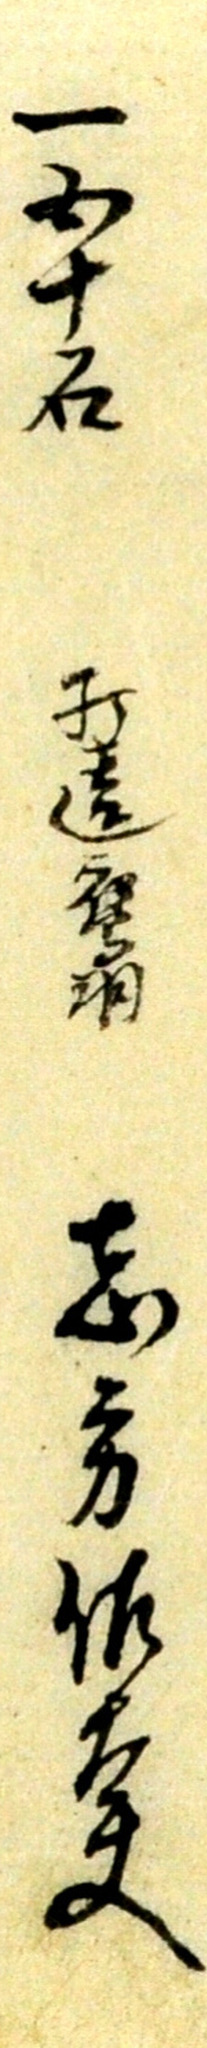一五十石打違鷹羽志方佐大夫
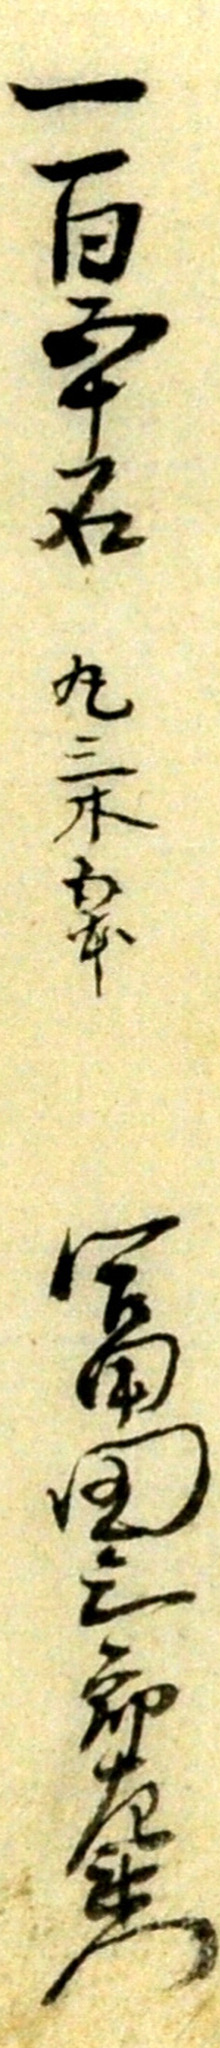一百五十石丸三木五本冨田三郎左衛門
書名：分限帳
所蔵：伊那市立高遠町図書館・合同会社AMANE
